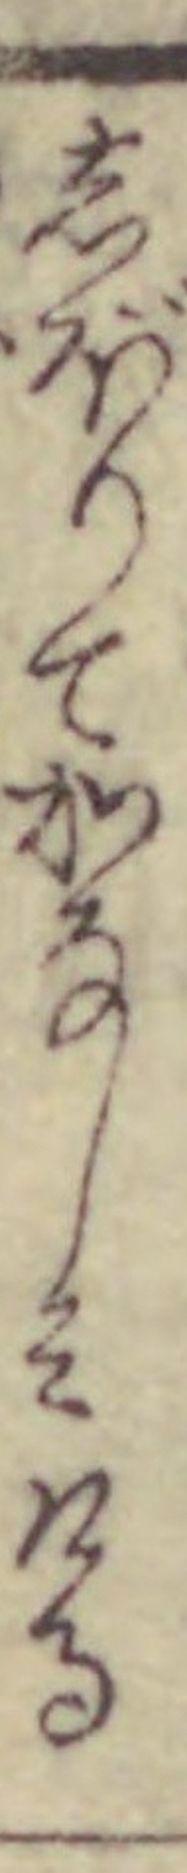しぼりてかなしみける
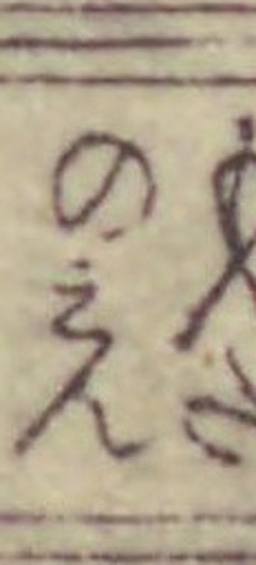のみん
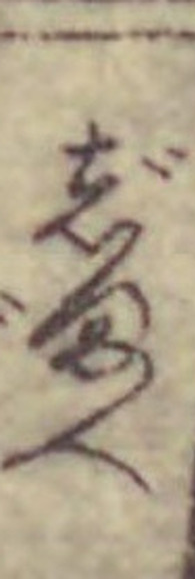じまへ
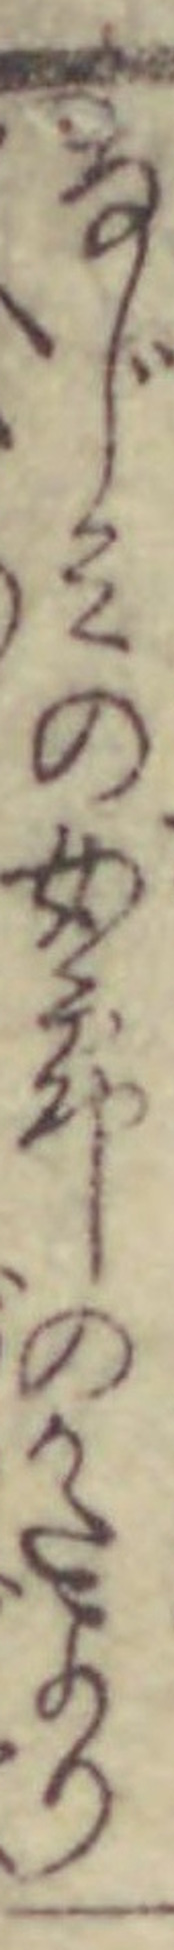なじみの女郎のかたより
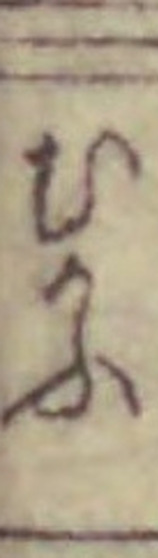むかふ
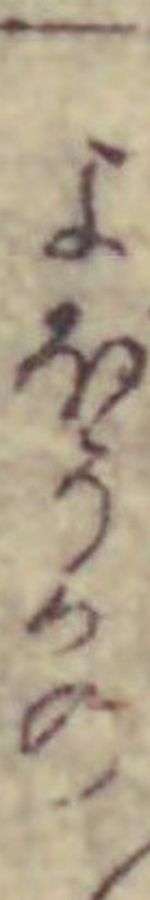よぼうかの
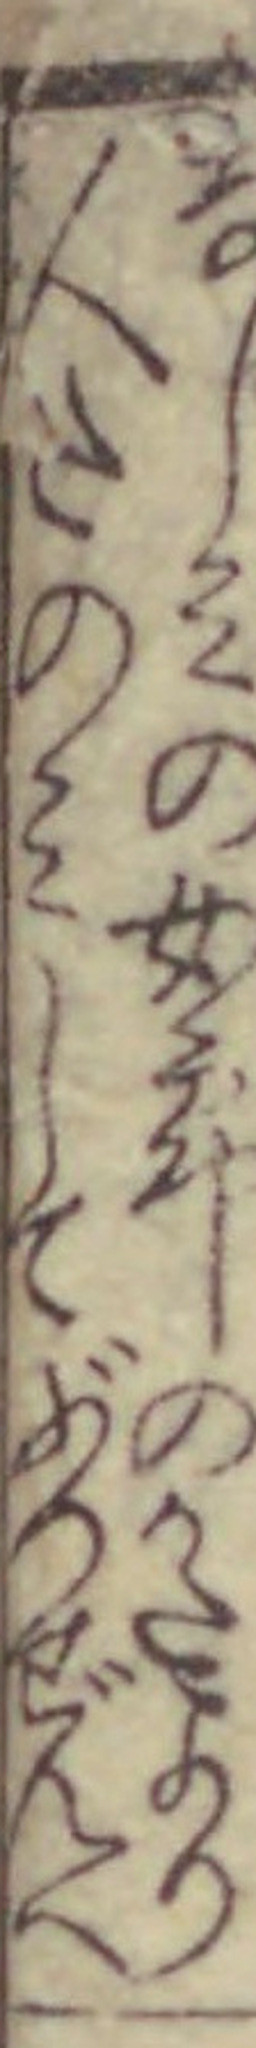人たのみしてぶつぜんへ
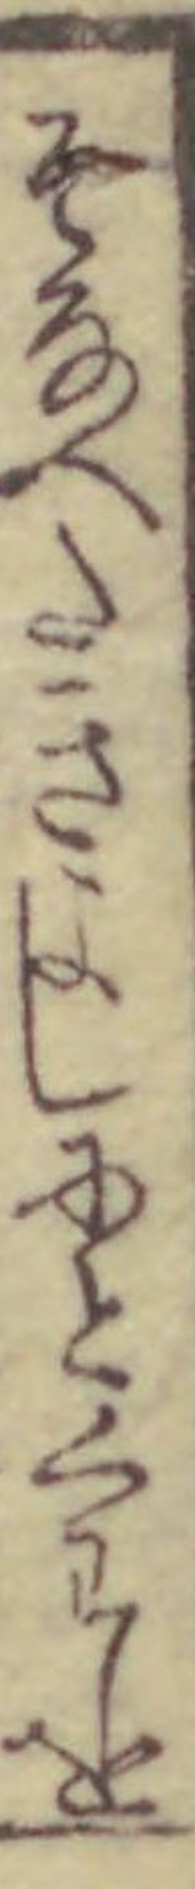そなへたきよしにとくわしを
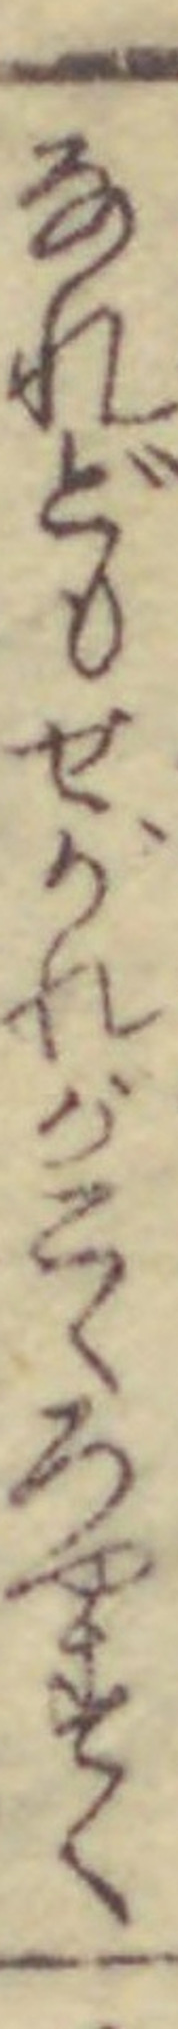なれどもせかれがこゝろやすく
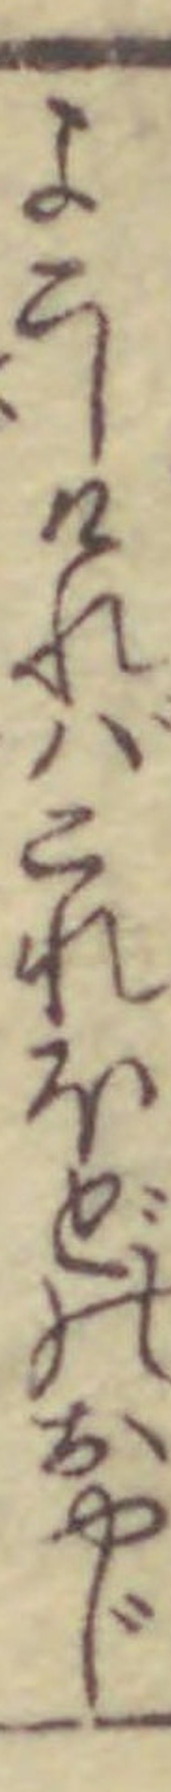よこしければこれほどのおやじ
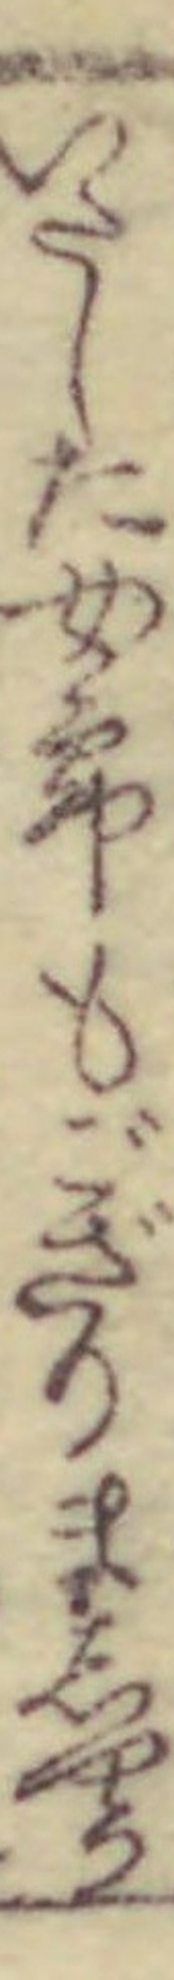いたした女郎もござりましやう
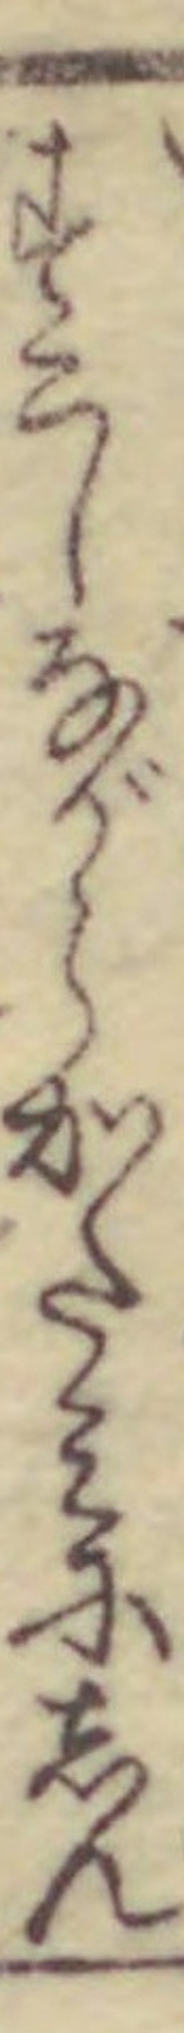すこしながらかたみにしん
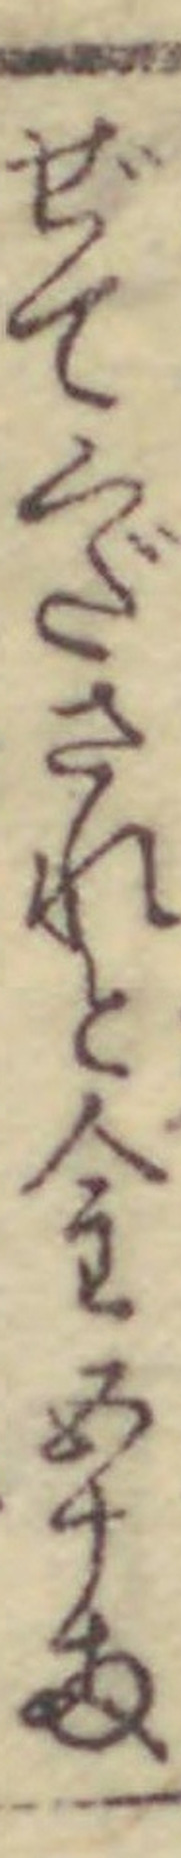ぜてくだされと金五十両
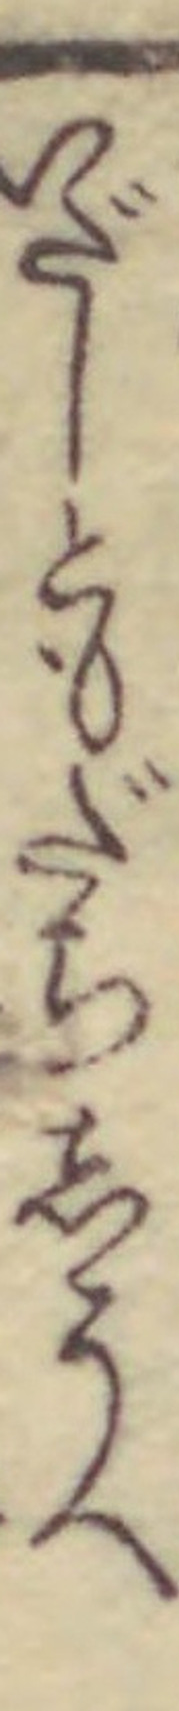いだしともだちしうへ
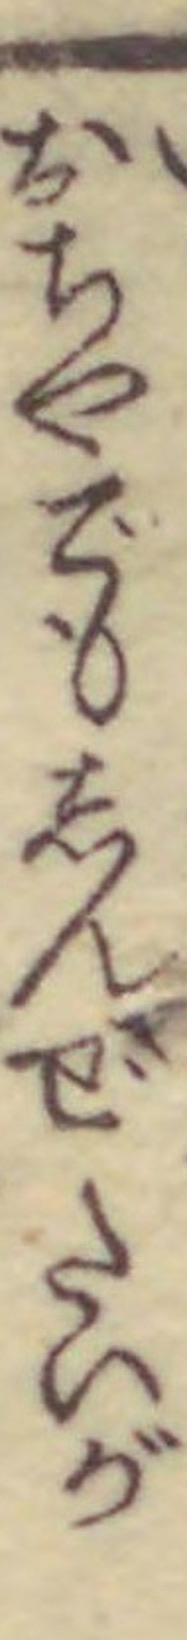おちやでもしんぜたいが
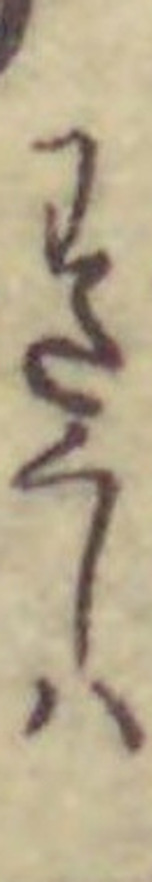わたくしは
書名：大通人穴[サガシ] 3巻
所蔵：国立国会図書館 National Diet Library, JAPAN
